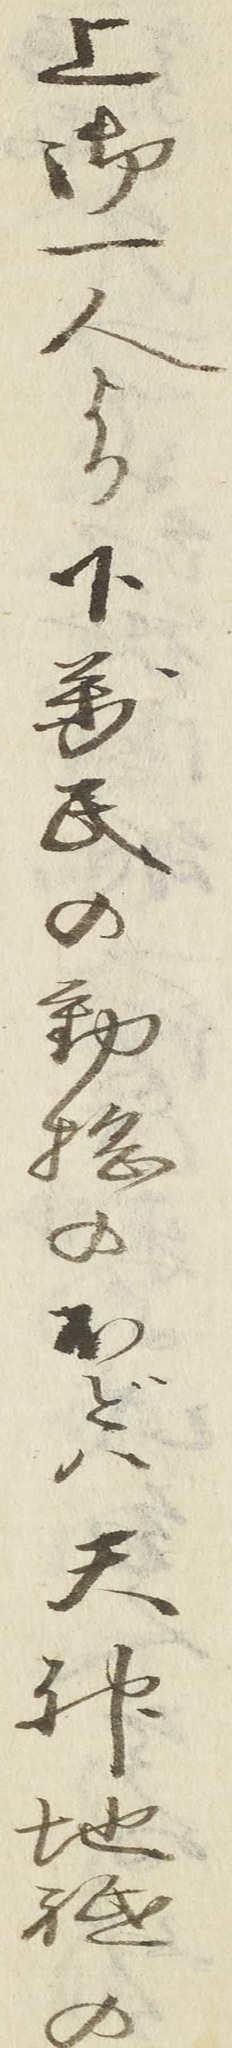上御一人より下万民の動揺のほどは天神地祇の
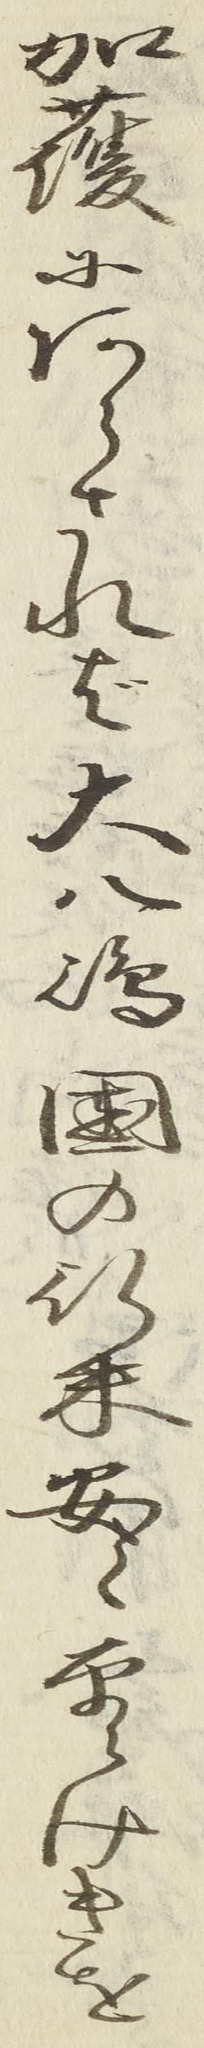加護にあらされば大八島国の往来安く平らけきを
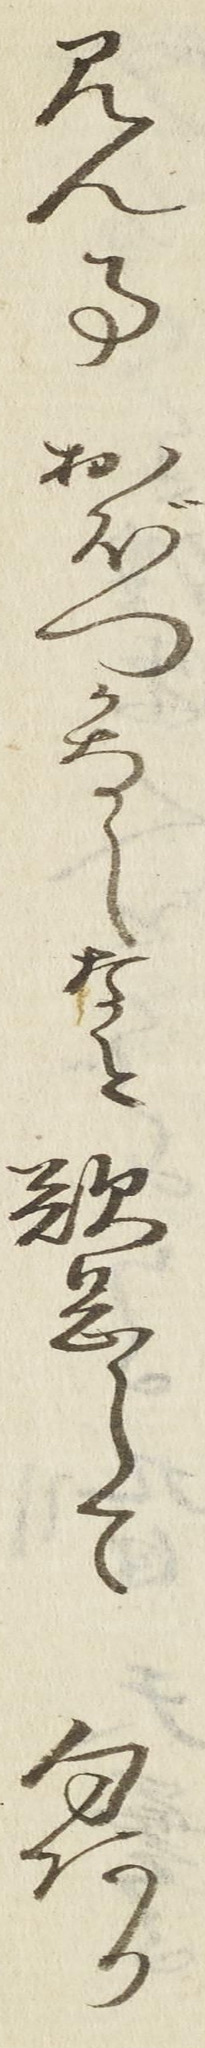見ん事おぼつかなしなと歎息して句あり
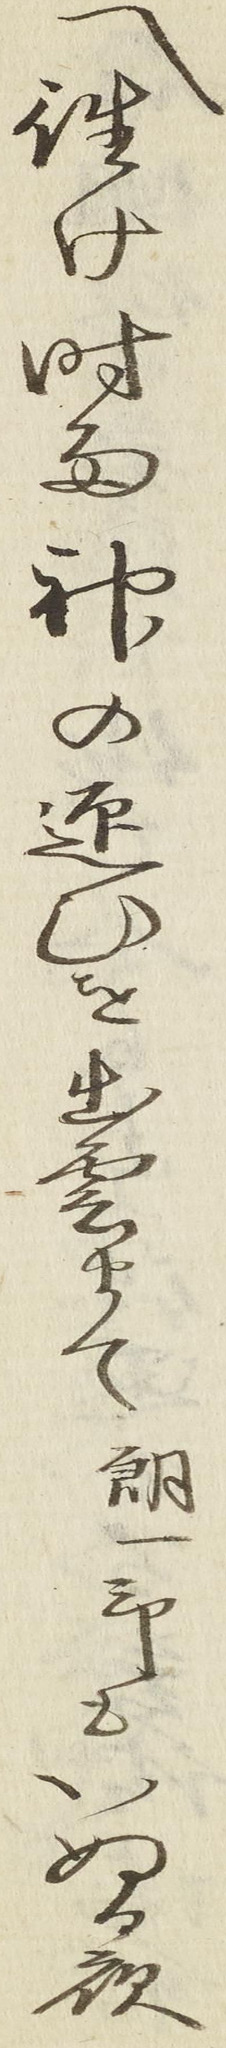〽往け時雨神の迎ひを出雲まて朗一予もいぬる夜
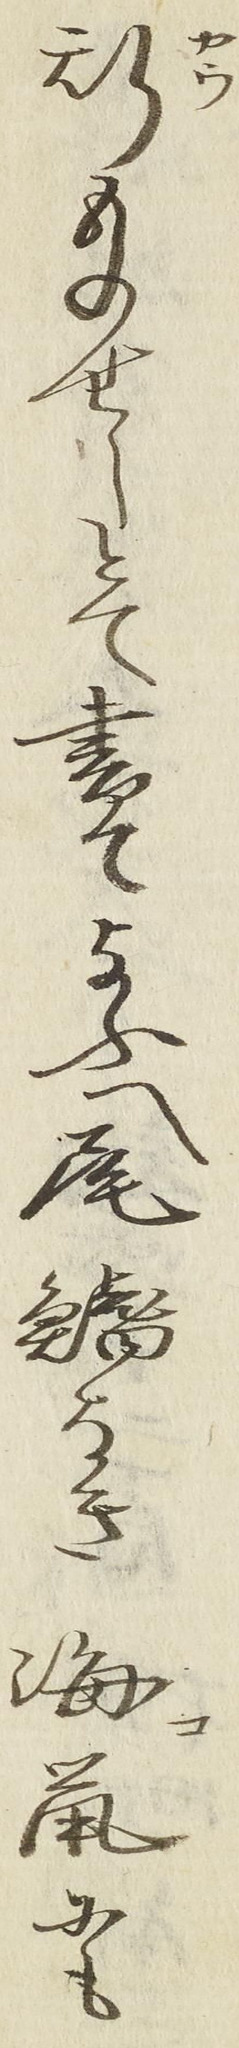斯ものせしとて書て与ふ〽尾鰭なき海鼠にも
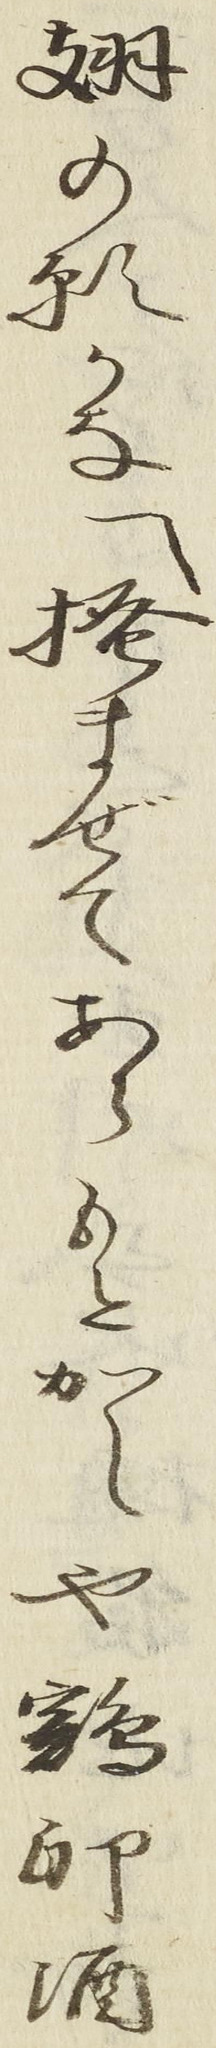翅の願かな〽掻きまぜてあらもとかしや鶏卵酒
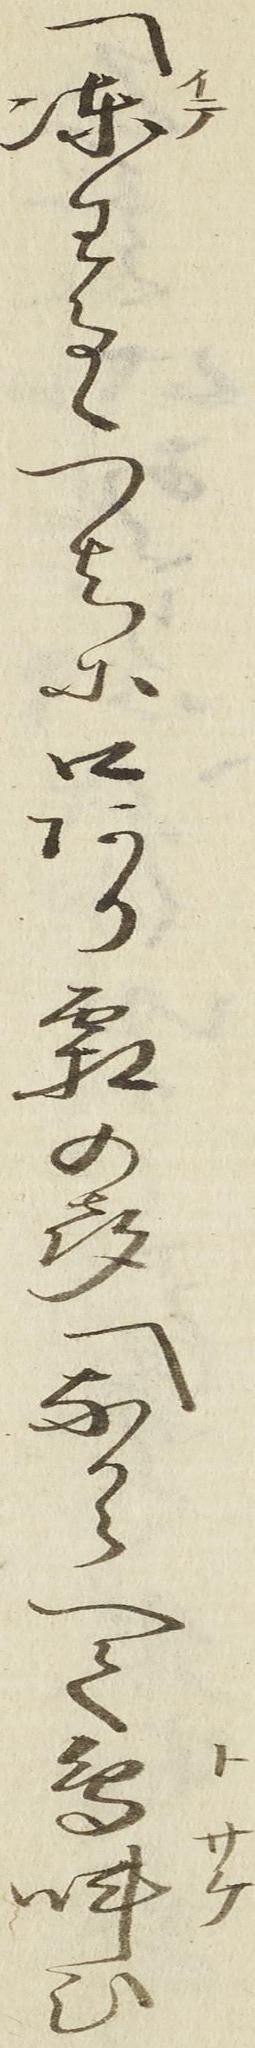〽凍わるゝ土に口あり霜の声〽なからへて鳥叫ひ
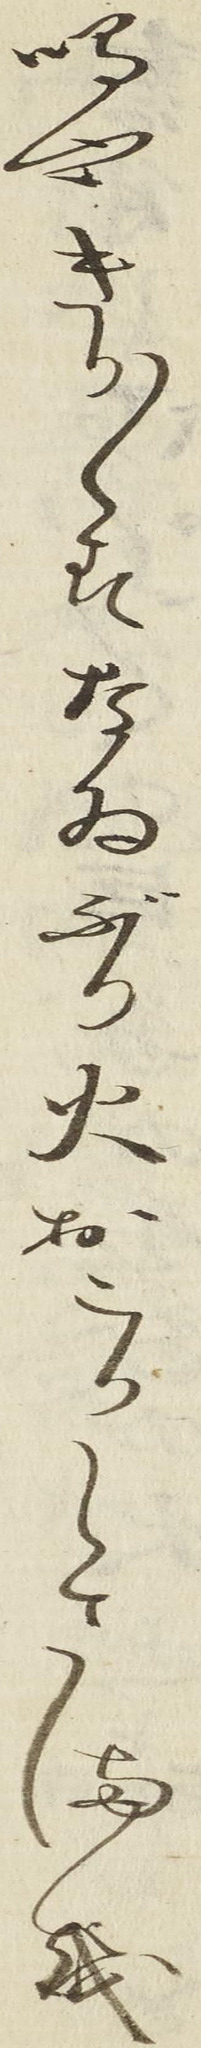鳴やきり〳〵すなゐぶり火おこりしさまを
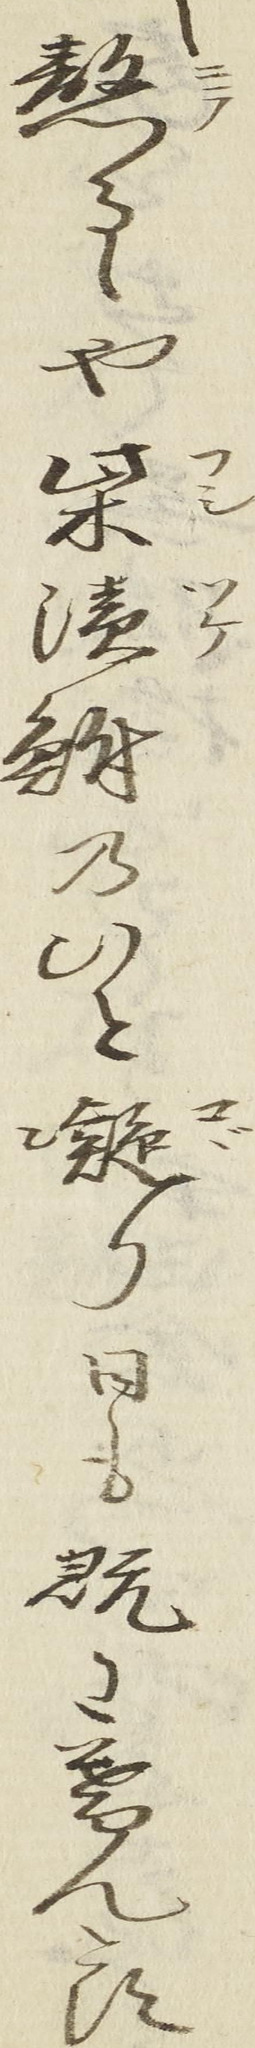〽熬るゝや柴漬鮒のひと凝り日も既に暮んとす
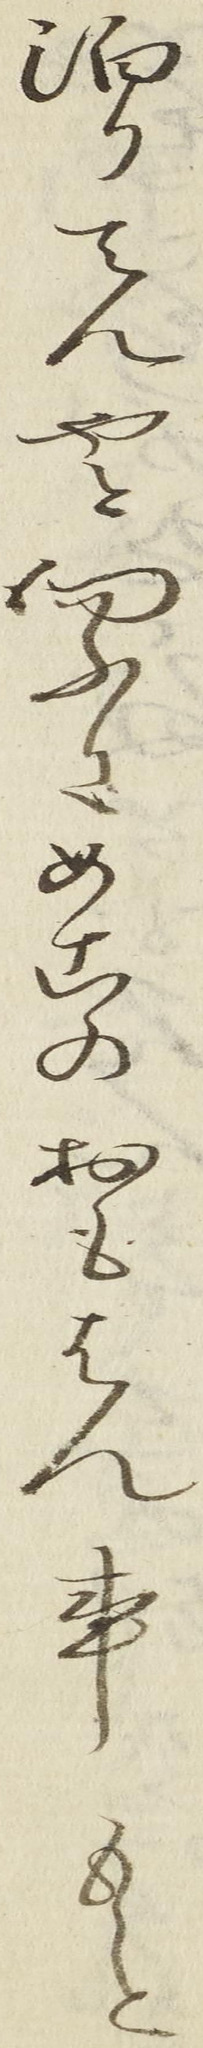泊りてんやと問ふにめこのおもはん事もと
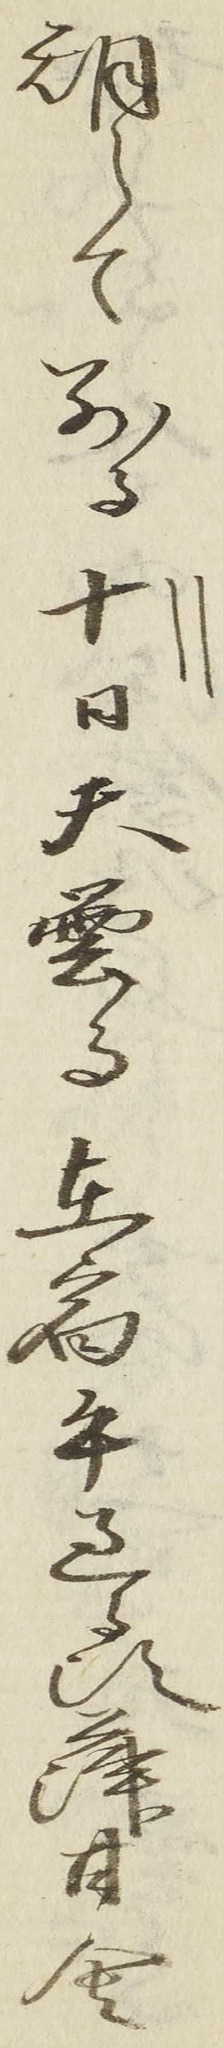期して別る十日天曇る在宿午過る頃葎？甘舎
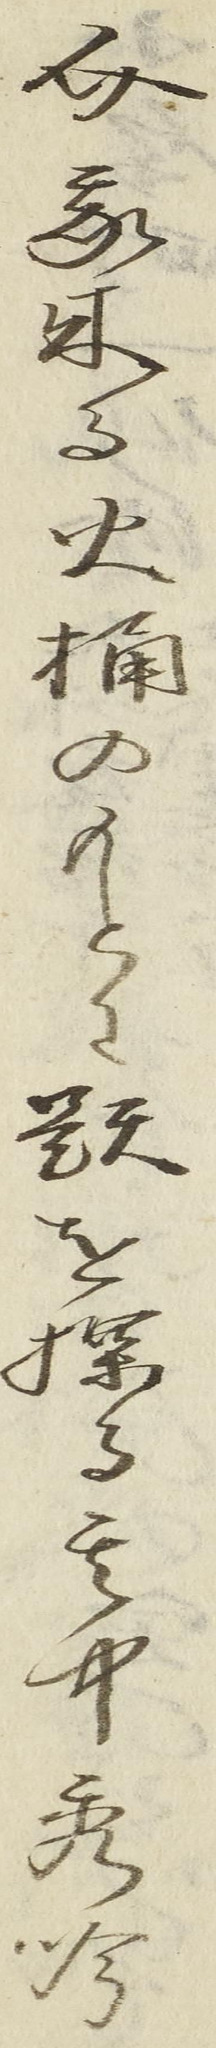介我来る火桶のもとに題を探る其中秀吟
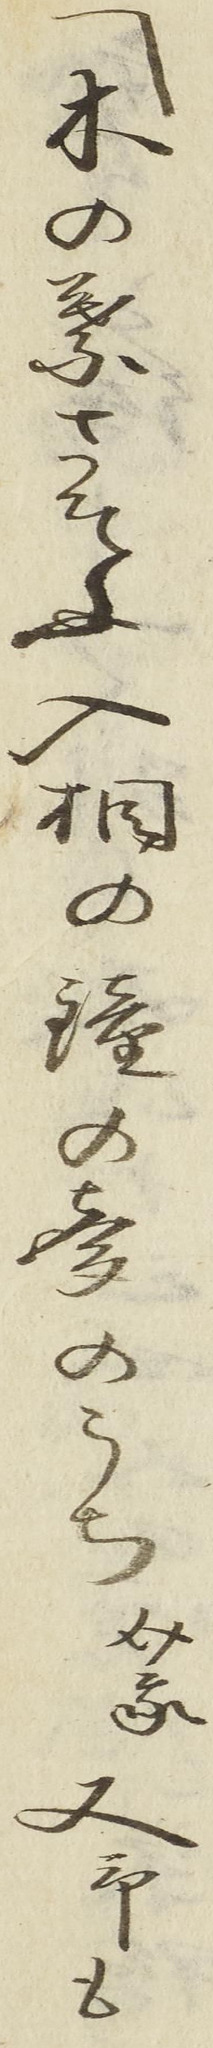〽木の葉さそふ入相の鐘の声のうち介我又予も
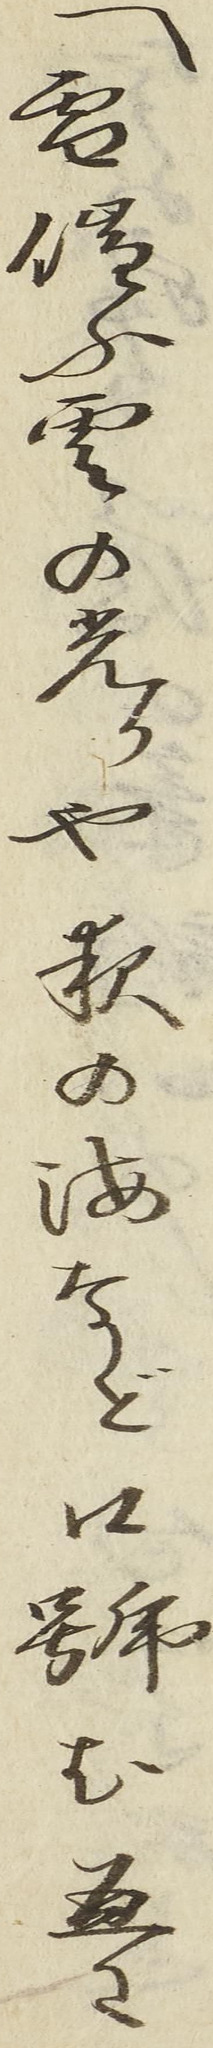〽雪催ふ雲の光りや夜の海など口嗁む互に

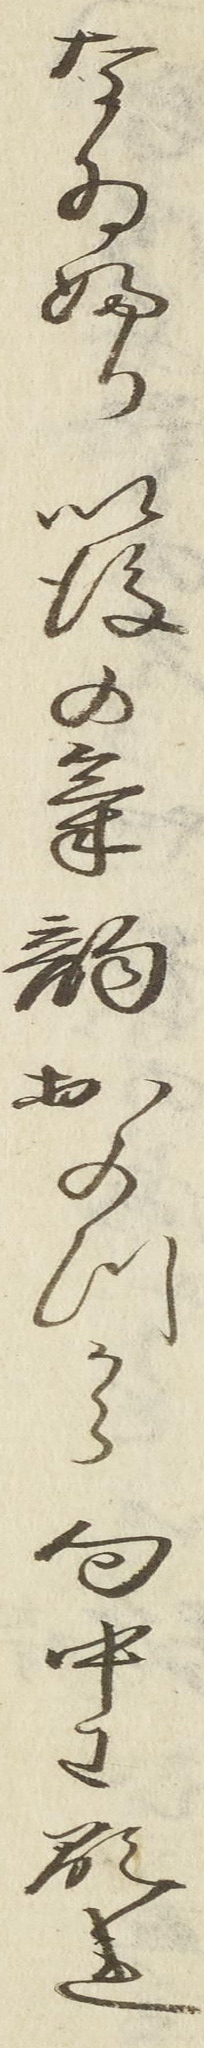なゐふり以後の気韻おのつから句中に顕れ
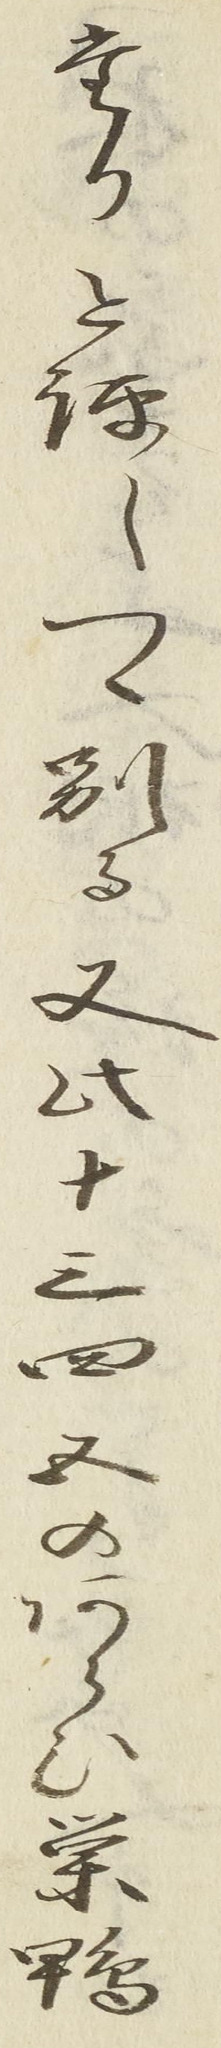たりと評しつゝ別る又此十三四五のあらひ巣鴨
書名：やぶれ窓の記　全
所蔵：東京大学地震研究所図書室 Earthquake Research Institute Library, The University of Tokyo, JAPAN
